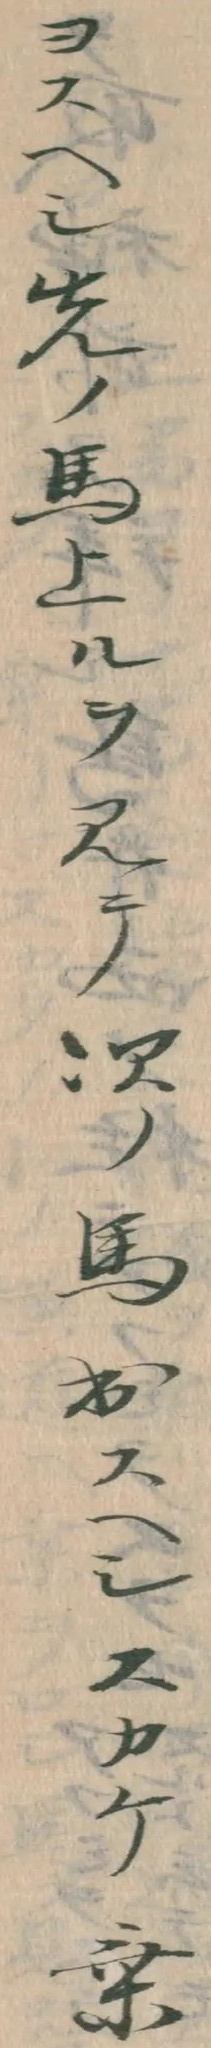ヨスへシ先ノ馬上ルヲ見テ次ノ馬出スヘシスカケ乗
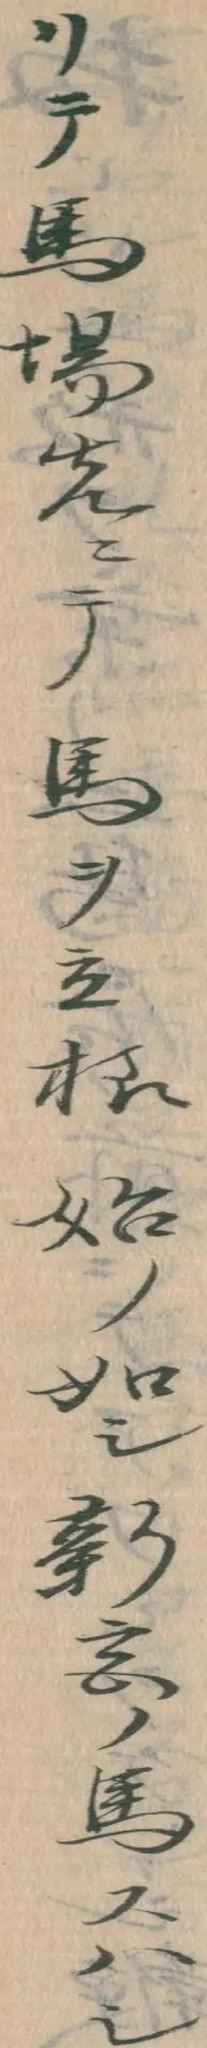リテ馬場先ニテ馬ヲ立様始ノ如シ新宮ノ馬スハシ
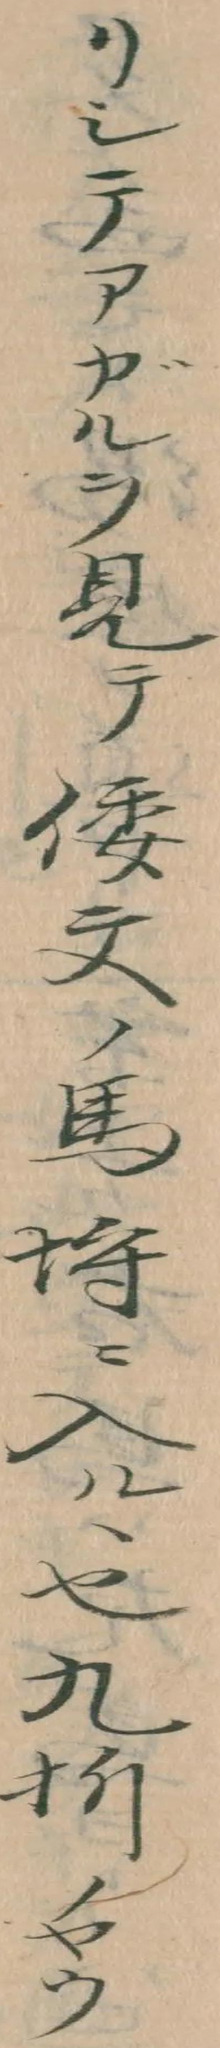リシテアガルヲ見テ倭文ノ馬埒ニ入ルヽ也九折ノヤウ
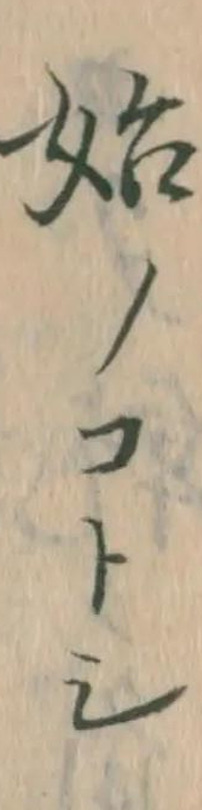始ノコトシ
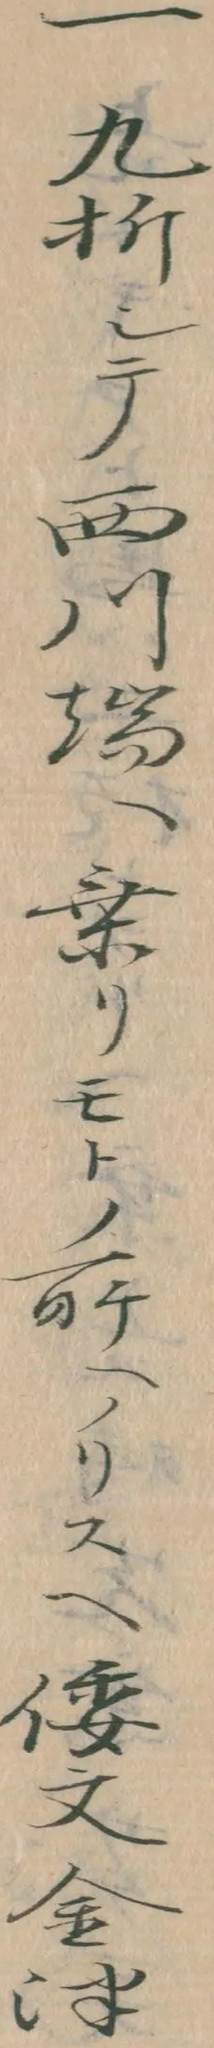一九折シテ西川端へ乗リモトノ所ヘノリスヘ倭文金津
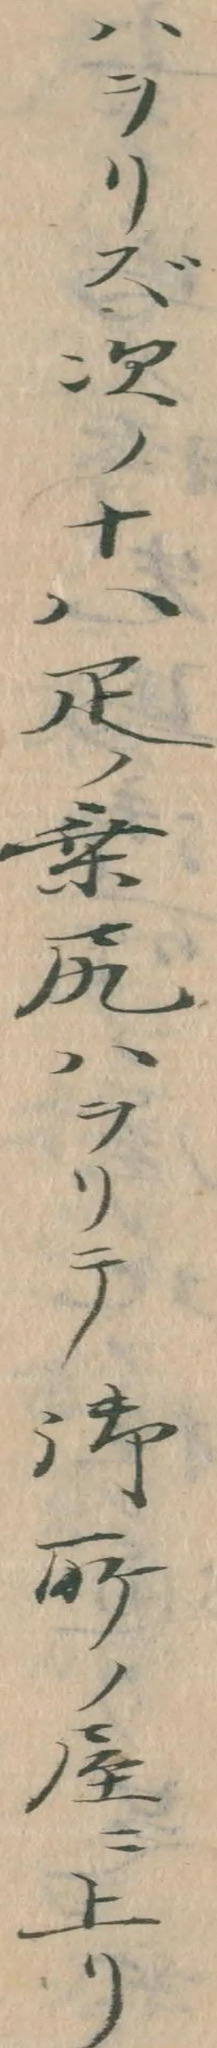ハヲリズ次ノ十八疋ノ乗尻ハヲリテ御所ノ屋ニ上リ
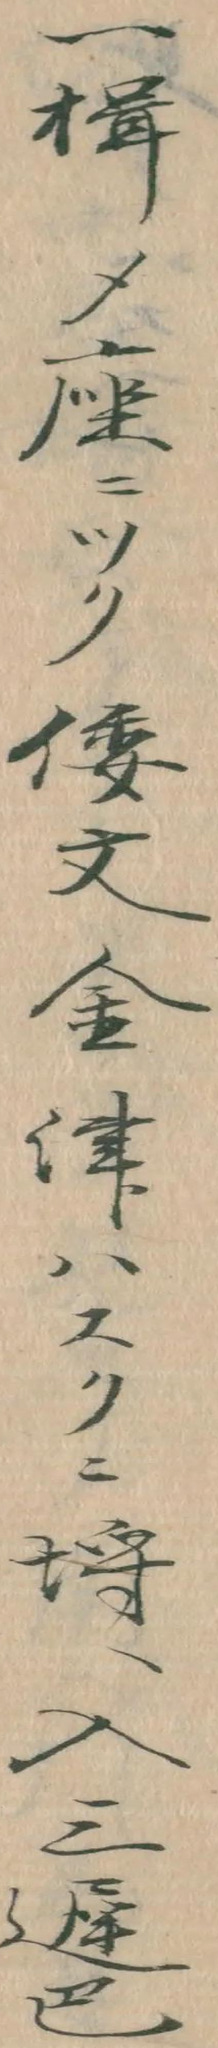一楫シテ座ニツク倭文金津ハスクニ埒ヘ入三遅巴
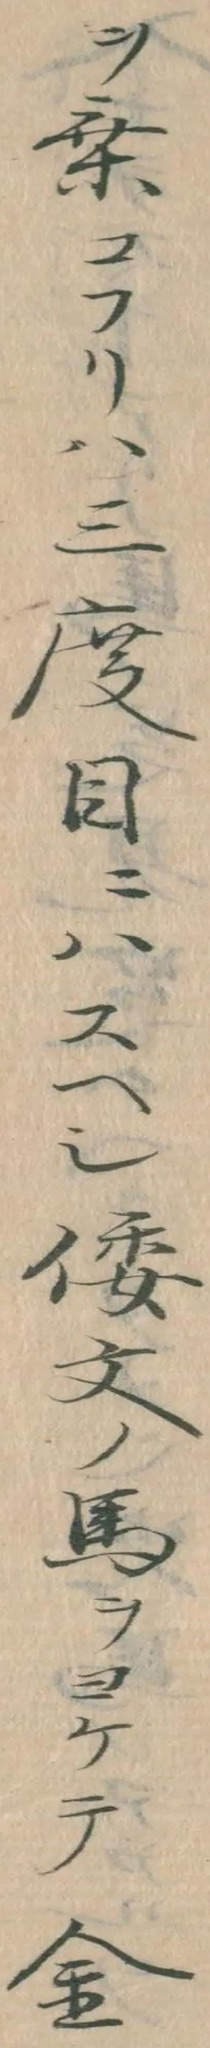ヲ乗コフリハ三度目ニハスヘシ倭文ノ馬ヲヨケテ金
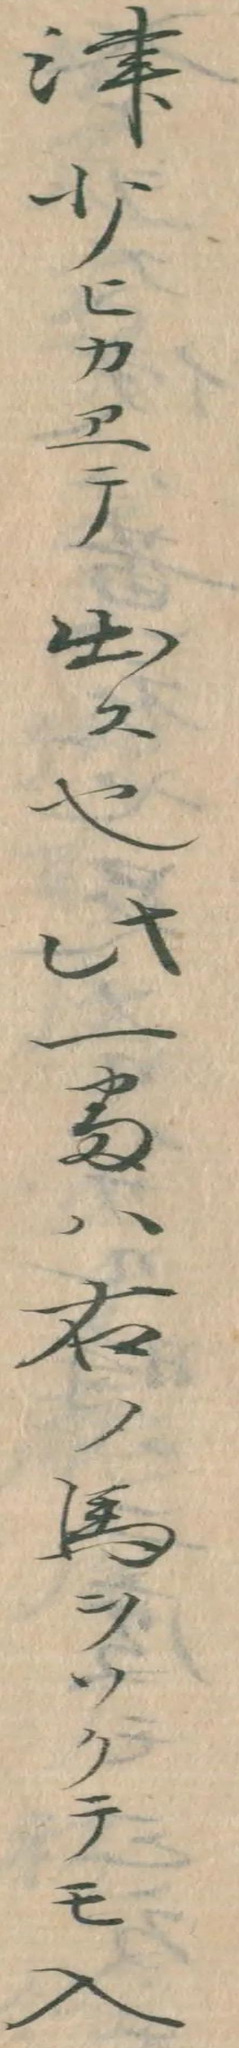津少ヒカヱテ出ス也此一番ハ右ノ馬ヲソクテモ入
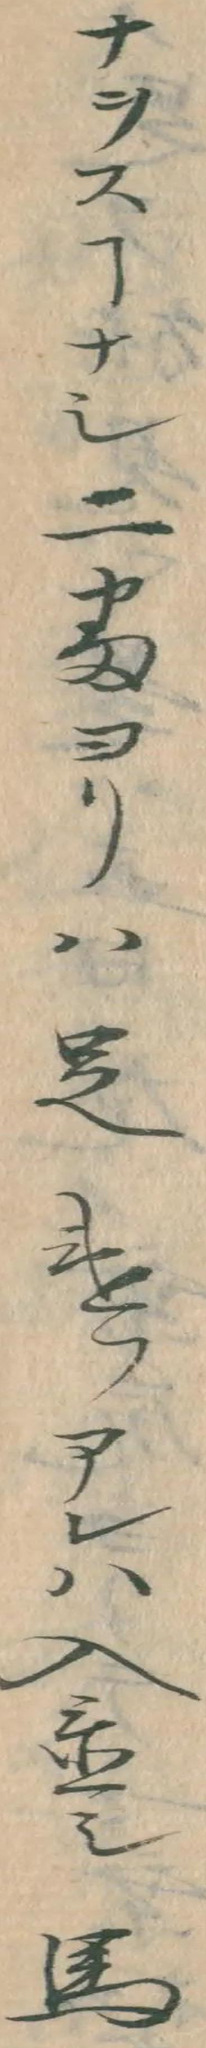ナヲスコトナシ二番ヨリハ足遣フアレハ入置シ馬

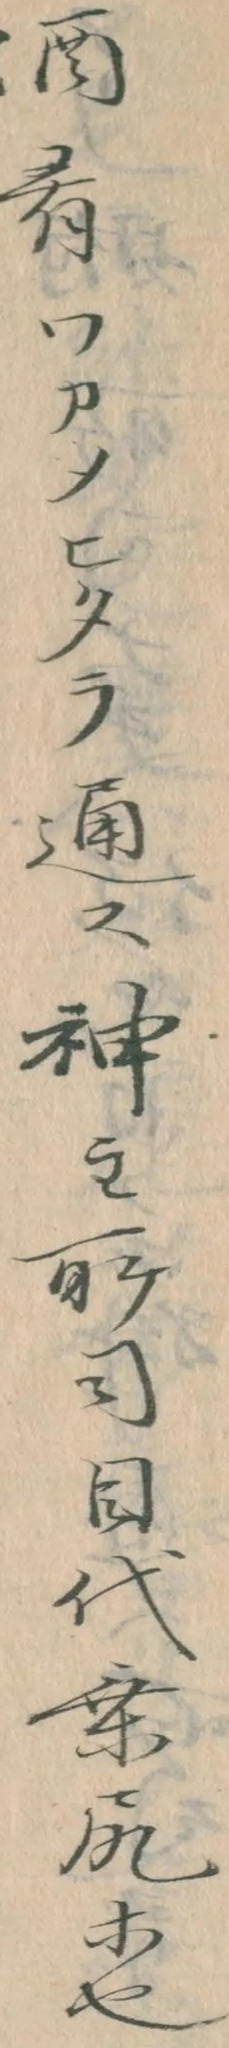酒肴ワカメヒタラ通ス神主所司目代乗尻等也
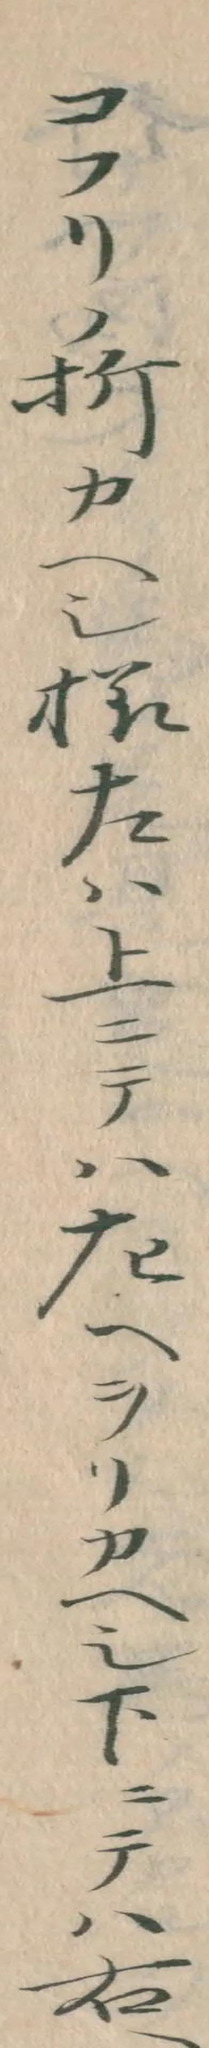一コフリノ折カヘシ様左ハ上ニテハ左へヲリカへシ下ニテハ右ヘ
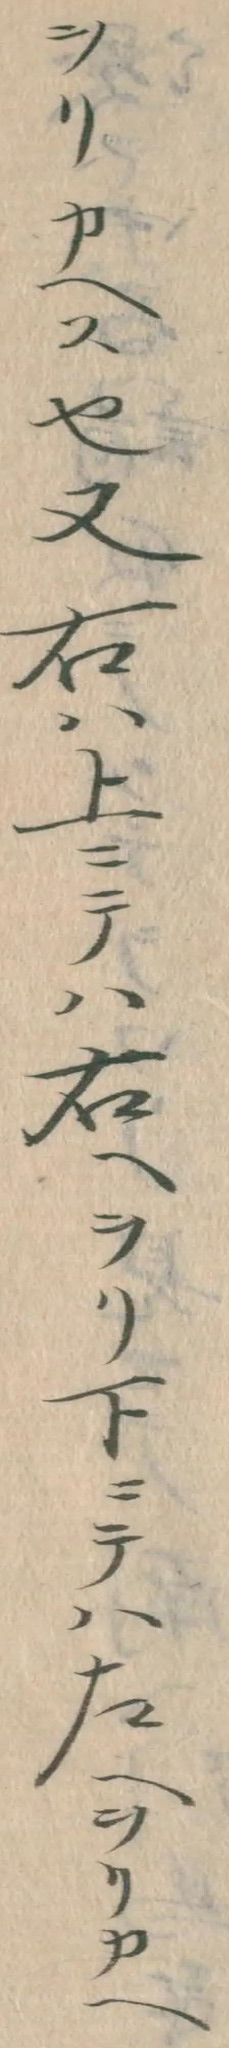ヲリカヘス也又右ハ上ニテハ右ヘヲリ下ニテハ左へヲリカヘ
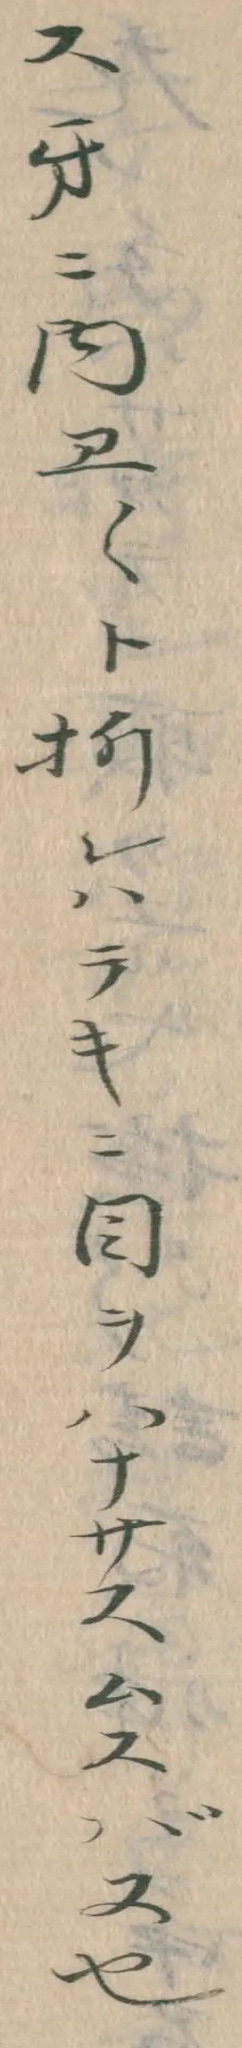ス牙ニ内ヱ〳〵ト折レハテキニ目ヲハナサスムスバヌ也
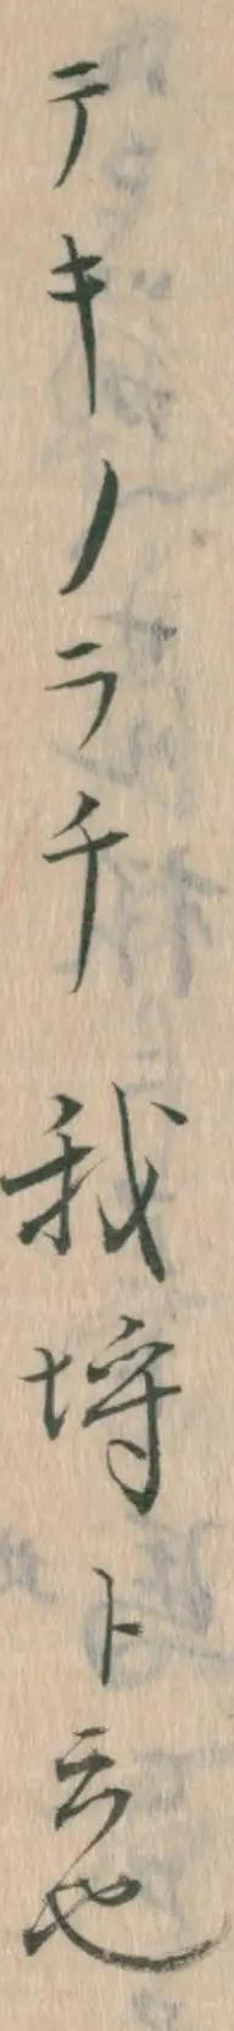テキノラチ我埒ト云也
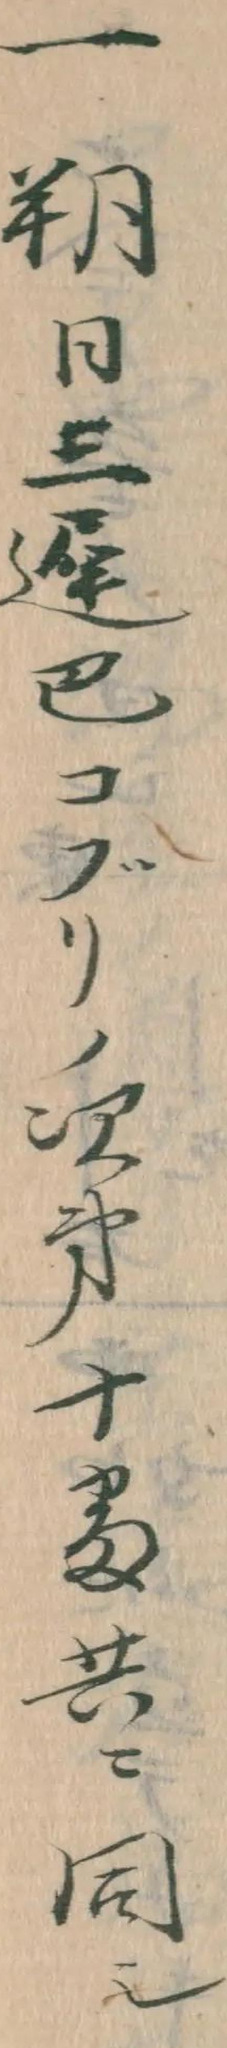一朔日三遅巴コブリノ次第十番共ニ同シ
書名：賀茂社記録. 第11冊
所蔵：国立国会図書館 National Diet Library, JAPAN
